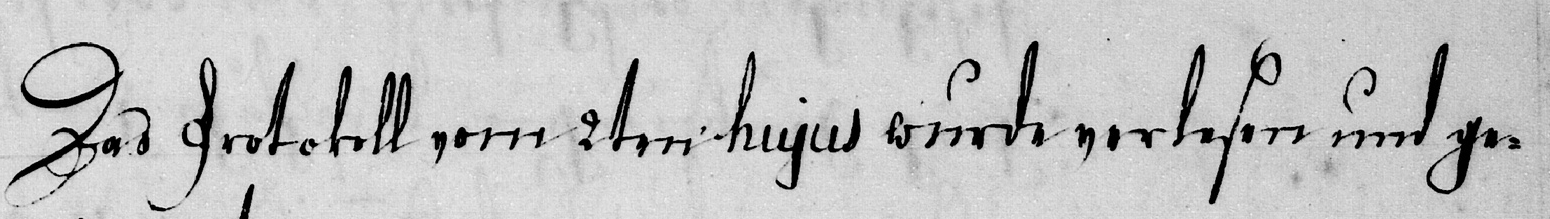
Das Protokoll vom 2ten hujus wurde verlesen und ge¬
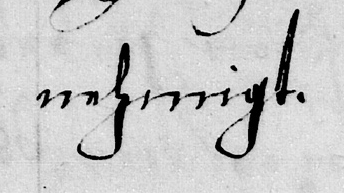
nehmigt.
